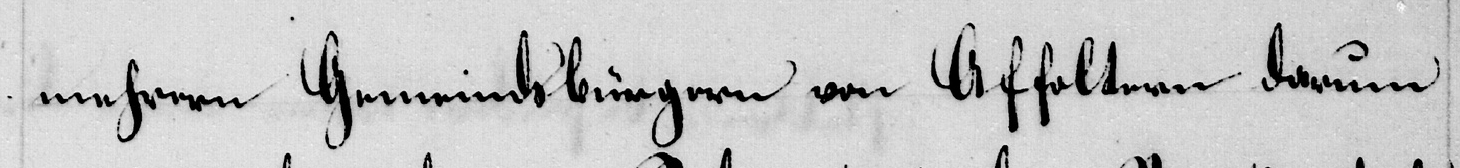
mehrern Gemeindsbürgern von Affoltern darum
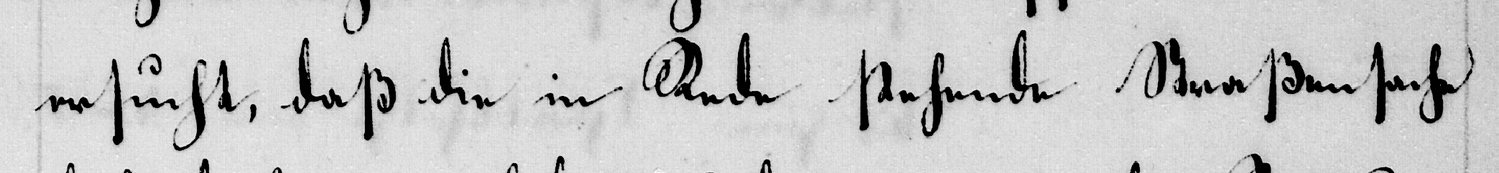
ersucht, daß die in Rede stehende Straßensache
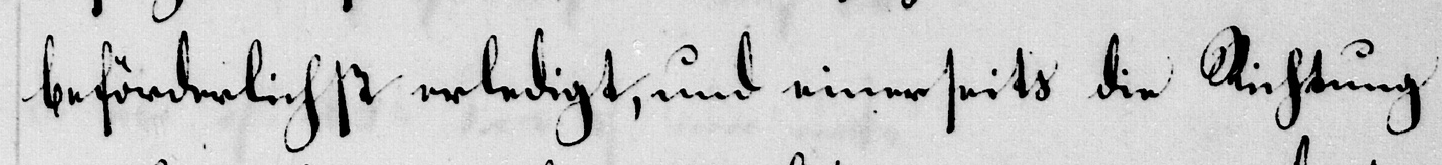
beförderlichst erledigt, und einerseits die Richtung
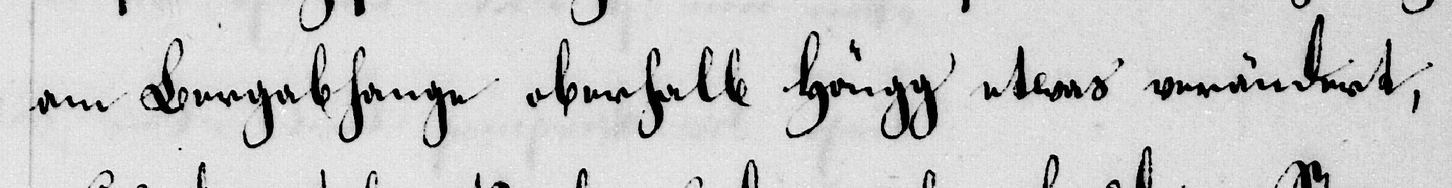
am Bergabhange oberhalb Höngg etwas verändert,
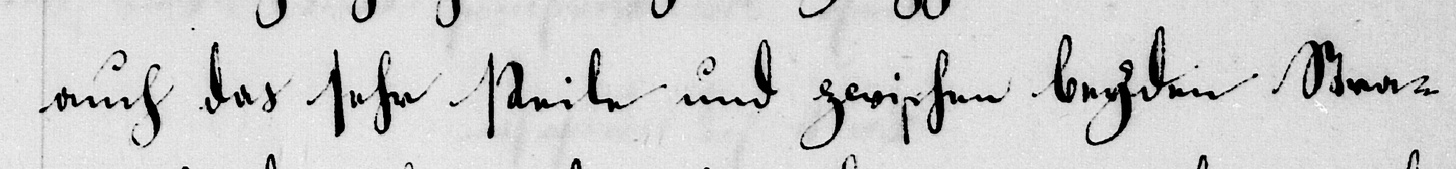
auch das sehr steile und zwischen beyden Stra¬
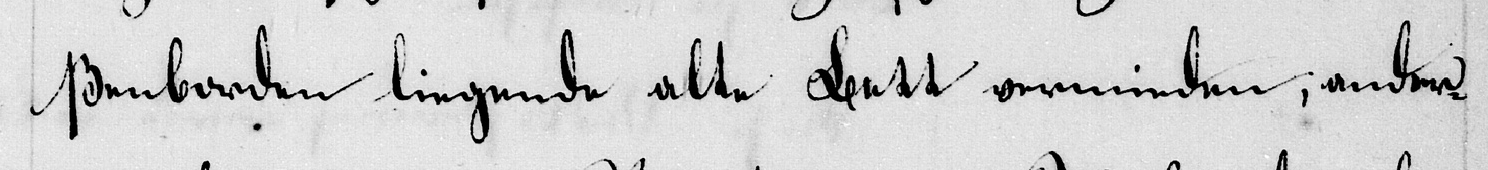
ßenborden liegende alte Bett vermieden; ander¬
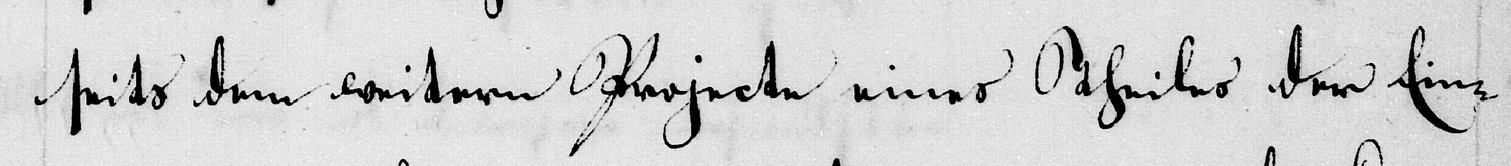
seits dem weitern Projecte eines Theiles der Ein¬
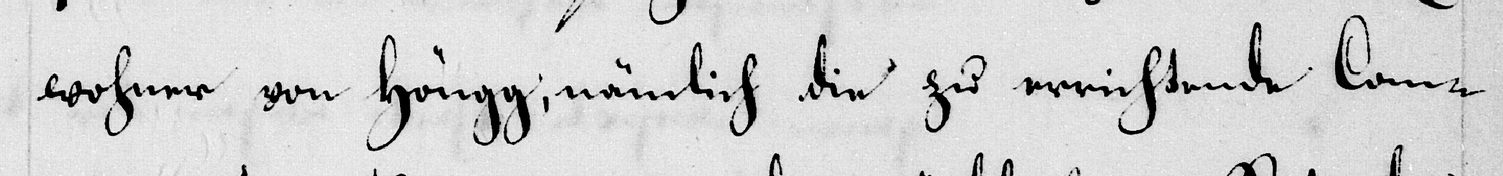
wohner von Höngg; nämlich die zu errichtende Com¬
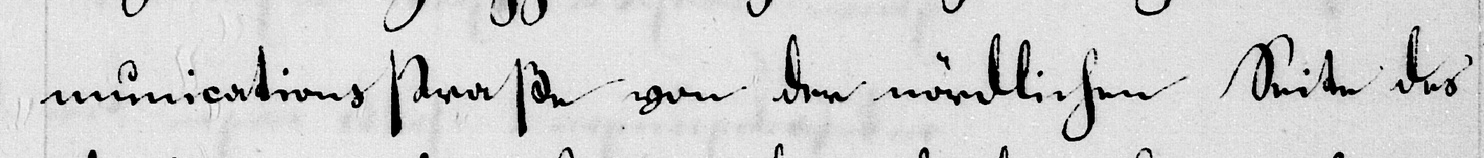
municationsstraße von der nördlichen Seite des
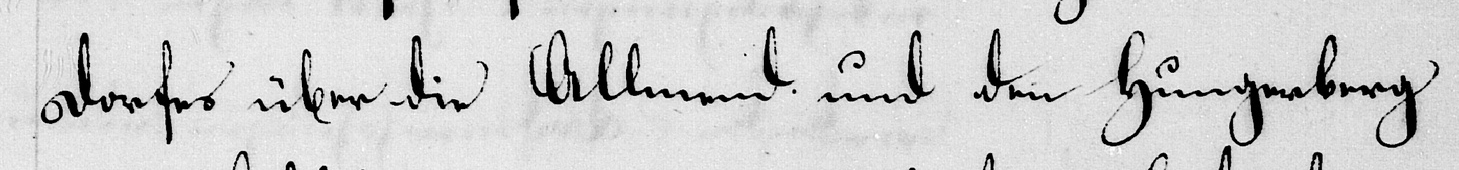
Dorfes über die Allmend und den Hungerberg
